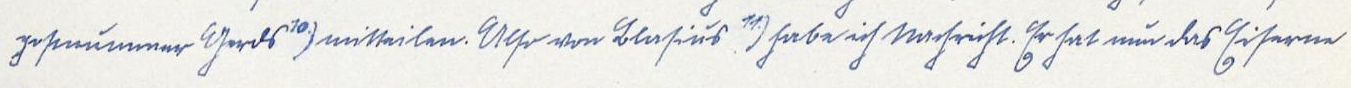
postnummer Gerds 10) mitteilen. Also von Blasius S) habe ich Nachricht. Er hat nun das Eiserne
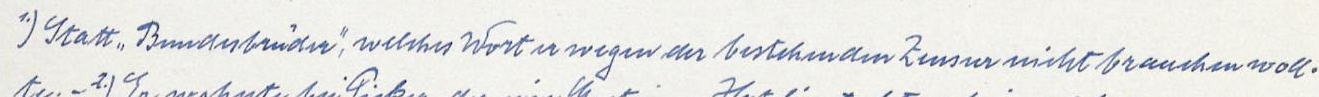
1.) Statt „Bundesbrüder“, welches Wort er wegen der bestehenden Zensur nicht brauchen woll-
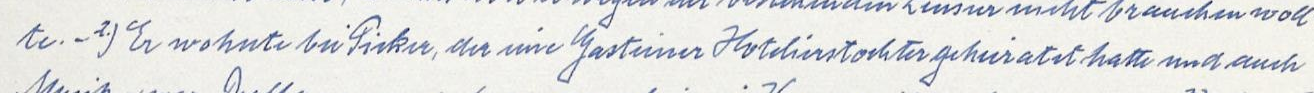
te.- 2) Er wohnte bei Pirker, der eine Gasteiner Hotelierstochter geheiratet hatte und auch
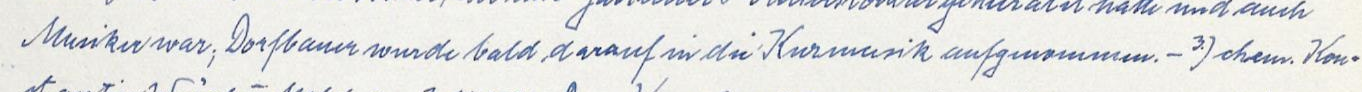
Musiker war. Dorfbauer wurde bald darauf in die Kurmusik aufgenommen.- 3) chem. Kon-
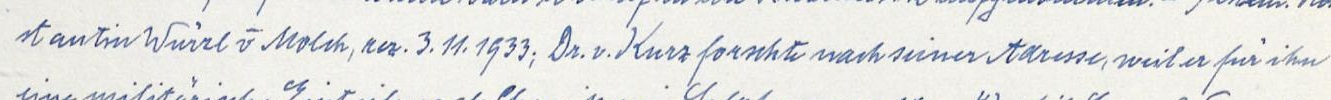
stantin Würzl v/o Molch, rez. 3. 11. 1933, Dr. v. Kurz forschte nach seiner Adresse, weil er für ihn
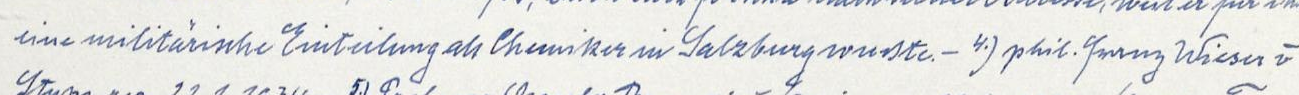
eine militärischen Einteilung als Chemiker in Salzburg wusste. - 4) phil. Franz Wieser v/o
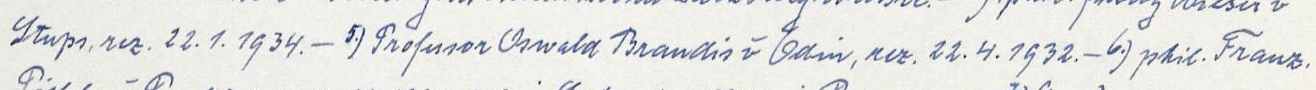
Stups, rez. 22. 1. 1934. 5) Professor Oswald Brandis v/o Odin, rez. 22. 4. 1932.- 6) phil. Franz.
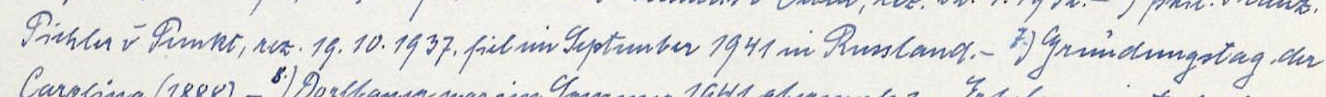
Pichler v/o Punkt, rez. 19. 10. 1937. fiel im September 1941 in Russland.- 7) Gründungstag der
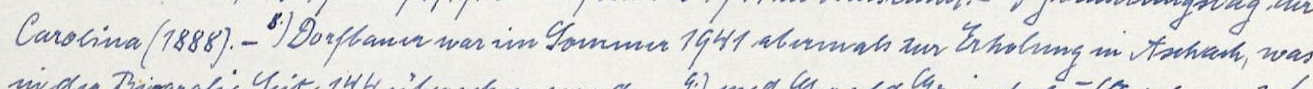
Carolina (1888). 8) Dorfbauer war im Sommer 1941 abermals zur Erholung in Aschach, was
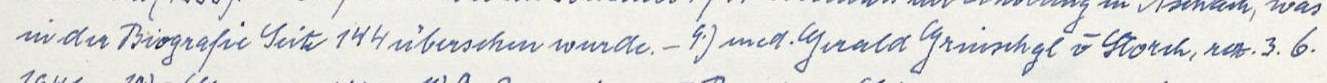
in der Biografie Seite 144 übersehen wurde. 9) med. Gerald Grischgl v/o Storch, rez. 3. 6.
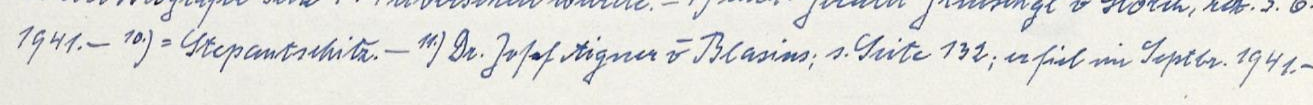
1941.- 10) Stepantschitz.- 11)Dr. Josef Aigner v/o Blasius, s. Seite 132; erhielt im Septbr 1941-
